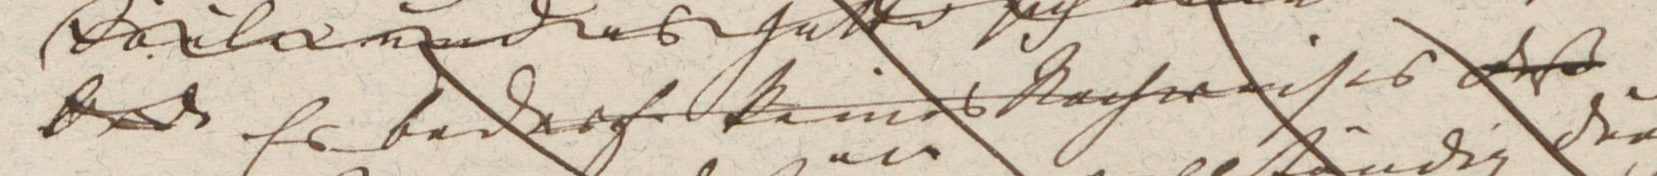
Ord Es bedarf keines Nachweises dass
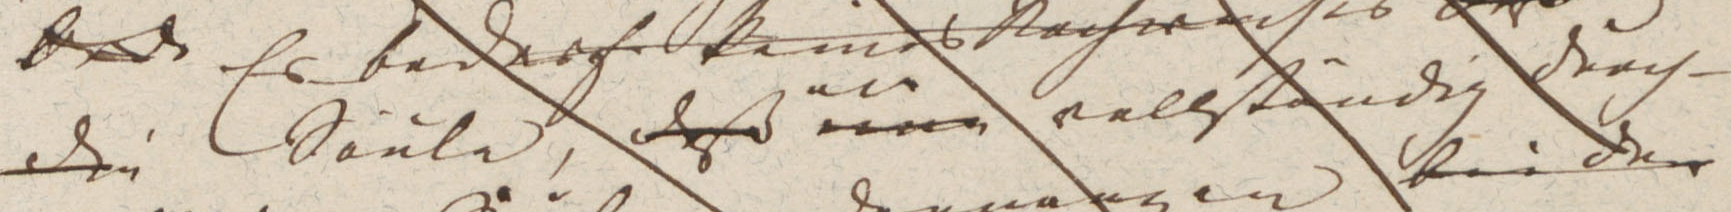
die Säule, dass eine ein vollständig durch-
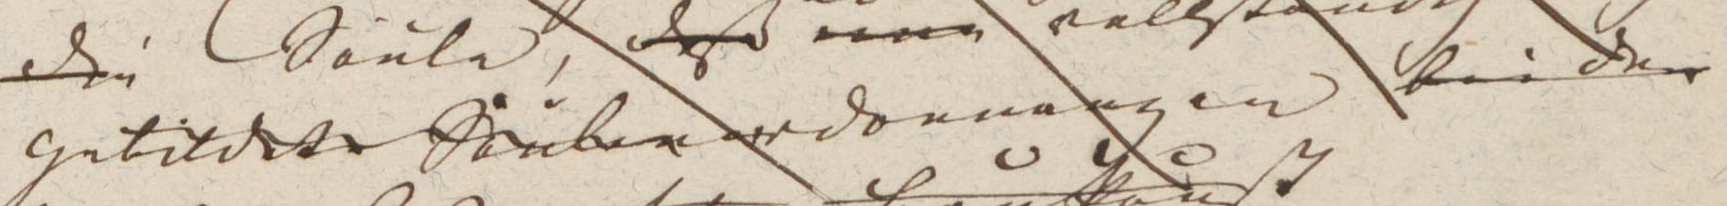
gebildete Säulenordonnanzen bei den
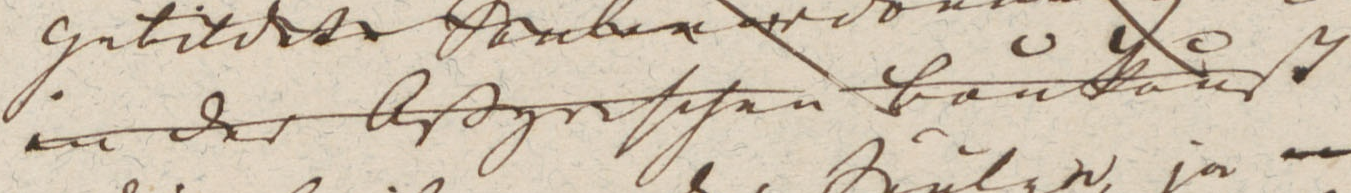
in der Assyrischen Baukunst
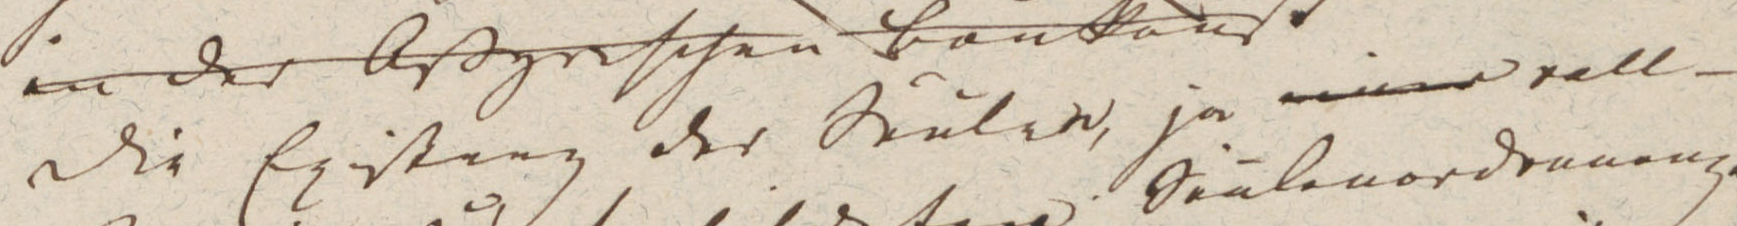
Die Existenz der Säulen, ja einer voll-
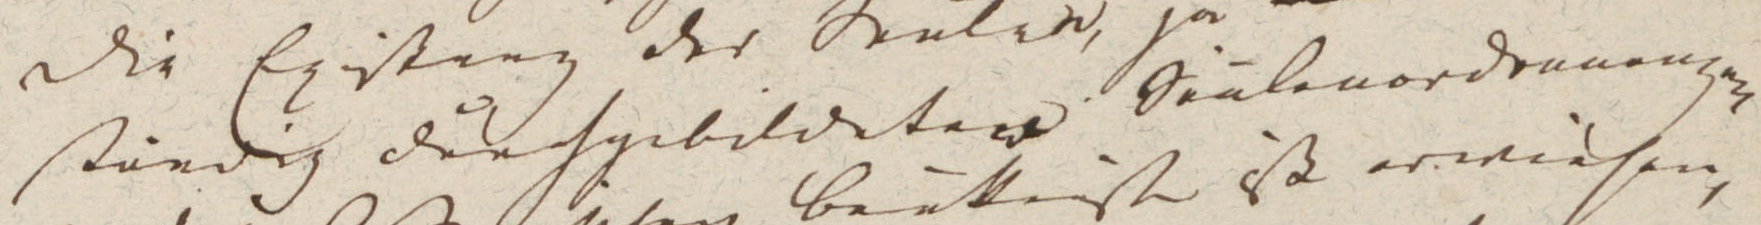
ständig durchgebildetenr Säulenordonnanzen
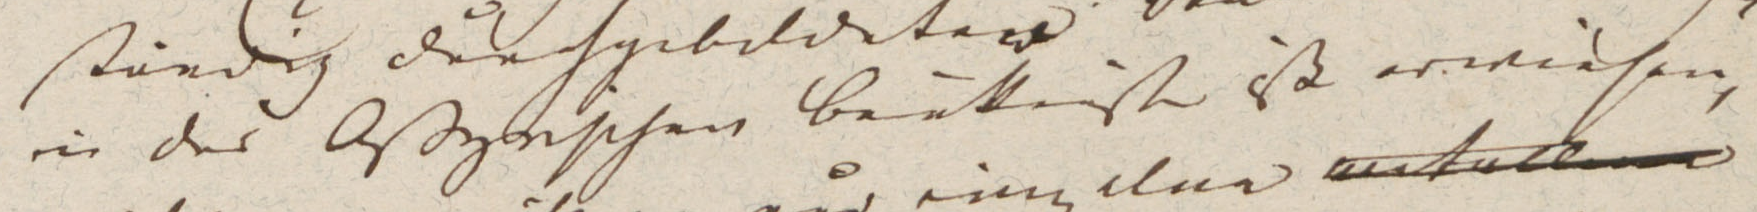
in der Assyrischen Baukunst ist erwiesen,
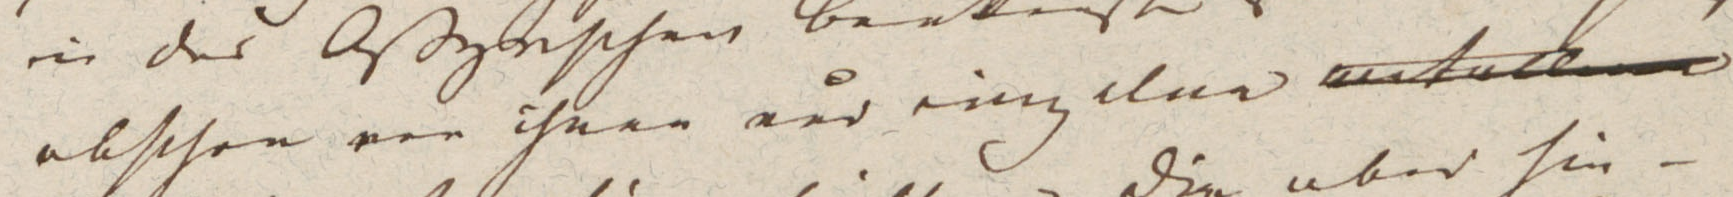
obschon von ihnen nur einzelne metallene
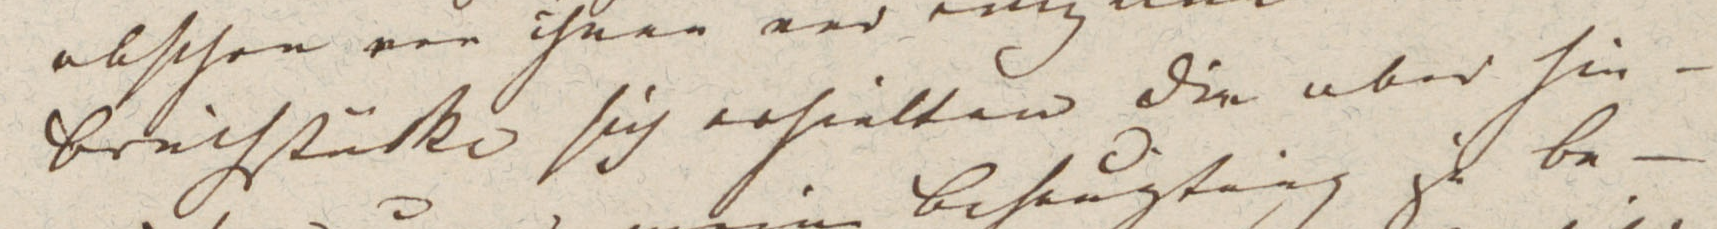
Bruchstücke sich erhielten die aber hin-
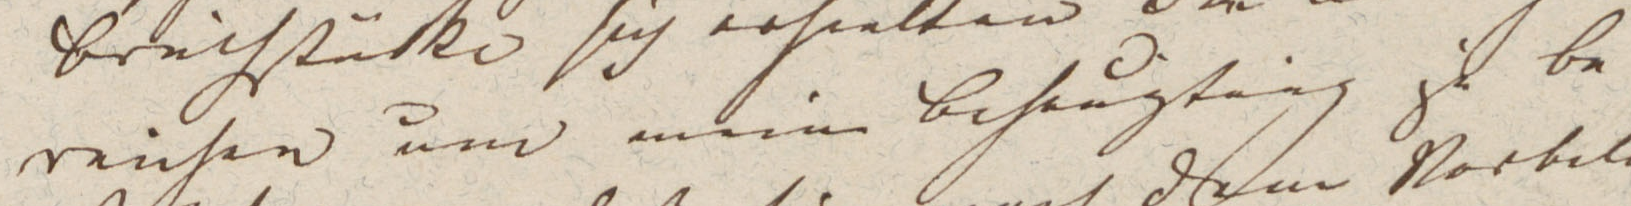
reichen um meine Behauptung zu be-
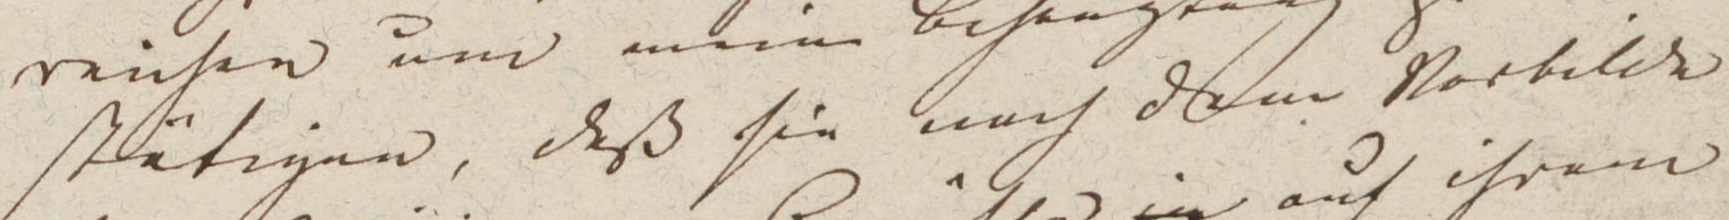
stätigen, dass sie nach dem Vorbilde
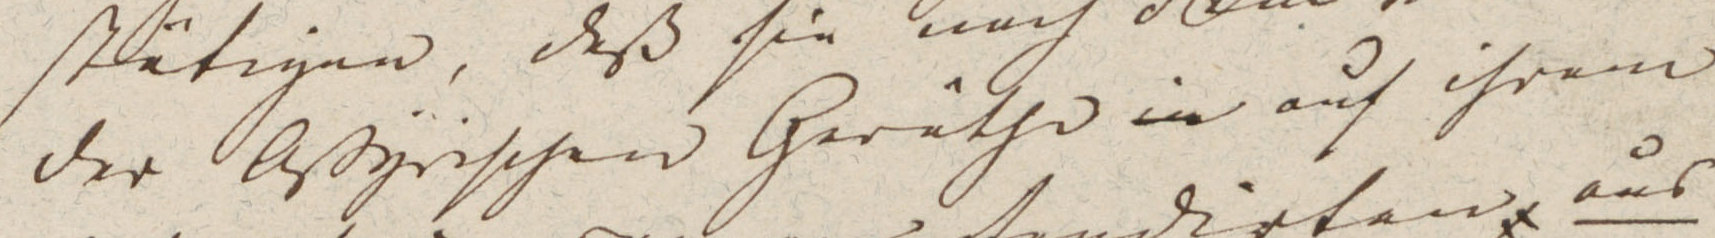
der Assyrischen Geräthe in auf ihrem
